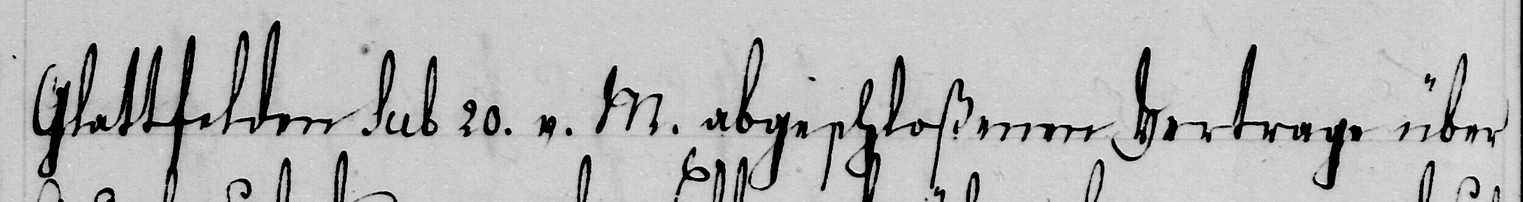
Glattfelden sub 20. v. M. abgeschloßenen Vertrage über
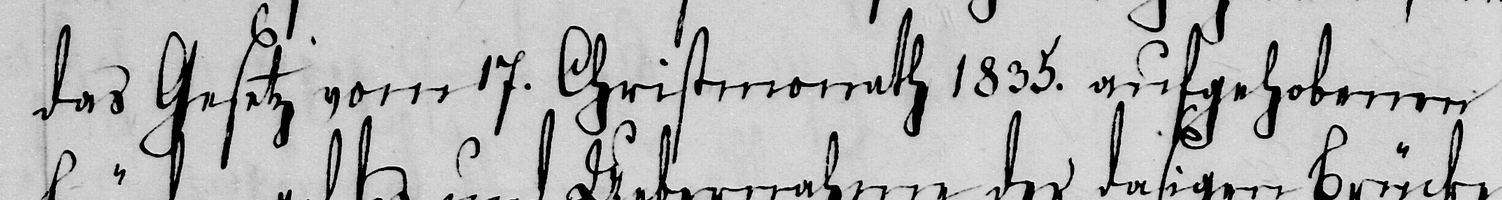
das Gesetz vom 17. Christmonath 1835. aufgehobenen
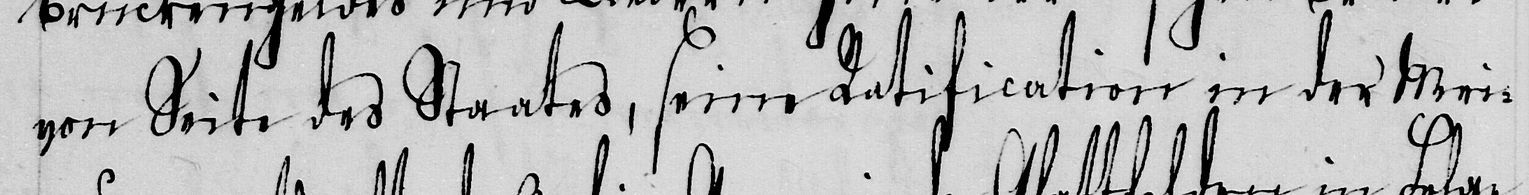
von Seite des Staates, seine Ratification in der Mei¬
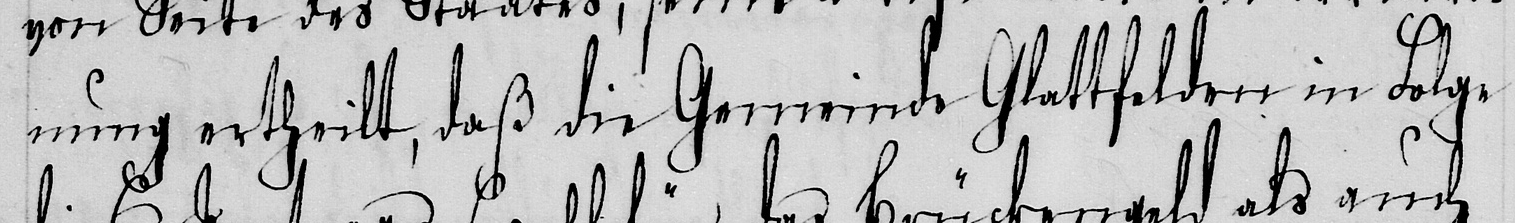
nung ertheilt, daß die Gemeinde Glattfelden in Folge
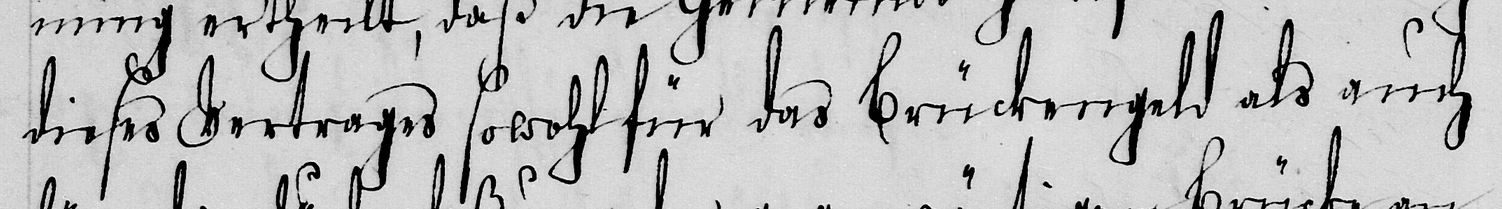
dieses Vertrages sowohl für das Brückengeld als auch
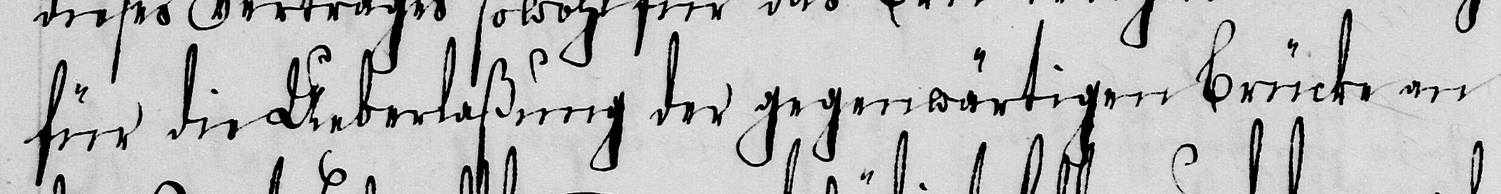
für die Ueberlaßung der gegenwärtigen Brücke an
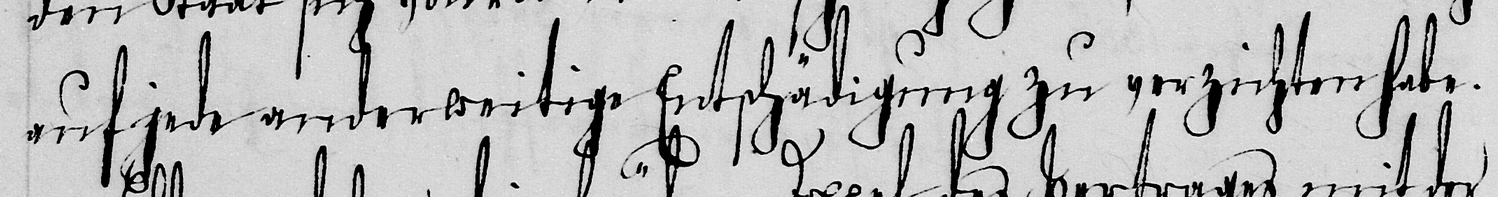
auf jede anderweitige Entschädigung zu verzichten habe.
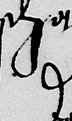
den
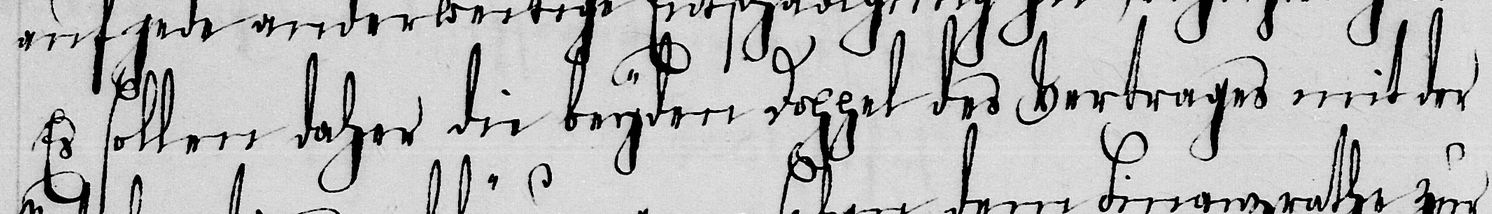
Es sollen daher die beyden Doppel des Vertrages mit der
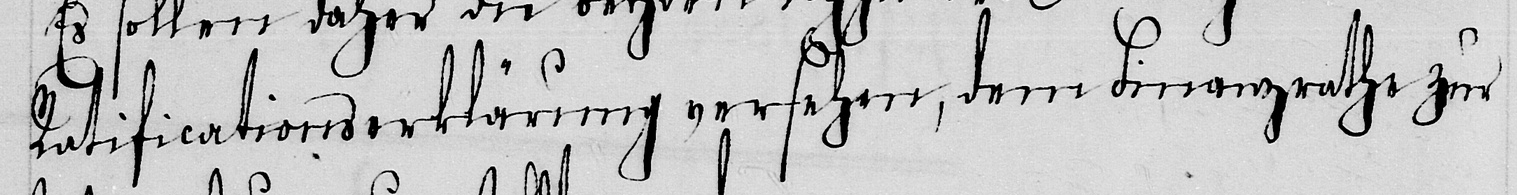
Ratificationserklärung versehen, dem Finanzrathe zur
